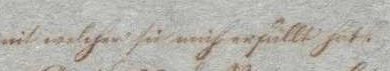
mit welcher sie mich erfüllt hat.
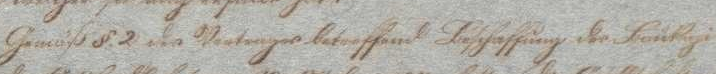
Gemäß § 2 des Vertrages betreffend Beschaffung des Baukapi-
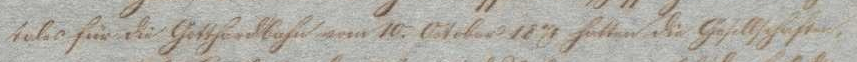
tales für die Gotthardbahn vom 10. October 1871 hatten die Gesellschaften,
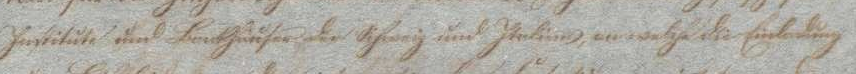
Institute und Bankhäuser der Schweiz und Italiens, an welche die Einladung
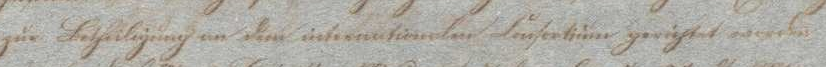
zur Betheiligung an dem internationalen Consortium gerichtet worden
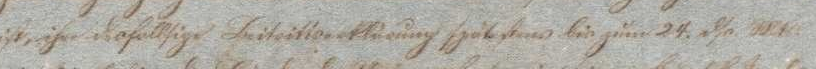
ist, ihre diesfallsige Beitrittserklärung spätestens bis zum 24. dss. Mts.
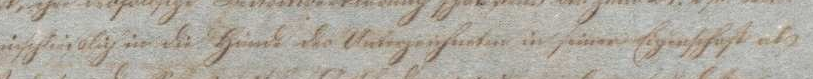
einschließlich in die Hände des Unterzeichneten in seiner Eigenschaft als
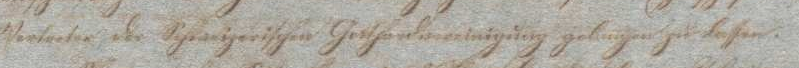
Vertreter der Schweizerischen Gotthardvereinigung gelangen zu lassen.
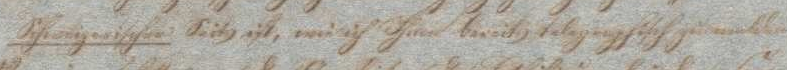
Schweizerischer Seits ist, wie ich Ihnen bereits telegraphisch zu melden
